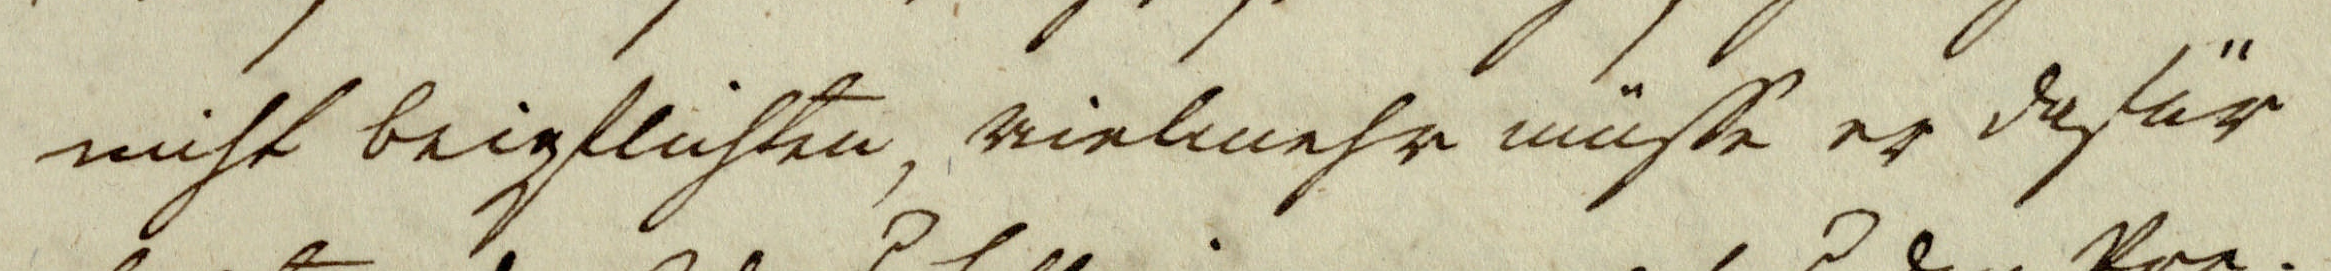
nicht beipflichten, vielmehr müsse er dafür
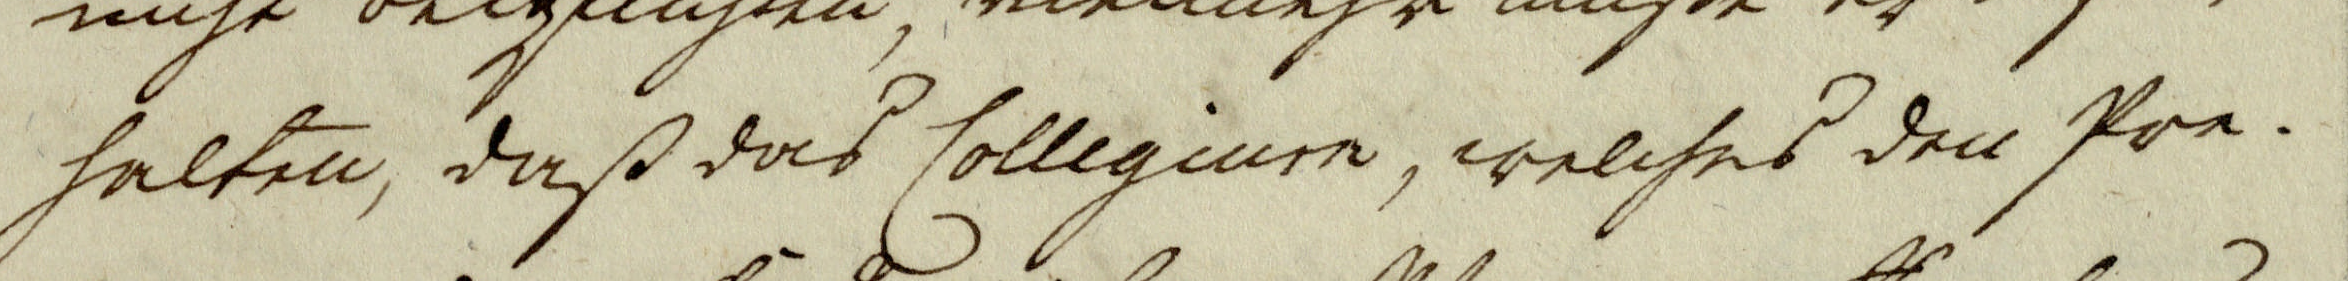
halten, daß das Collegium, welches den Pre¬
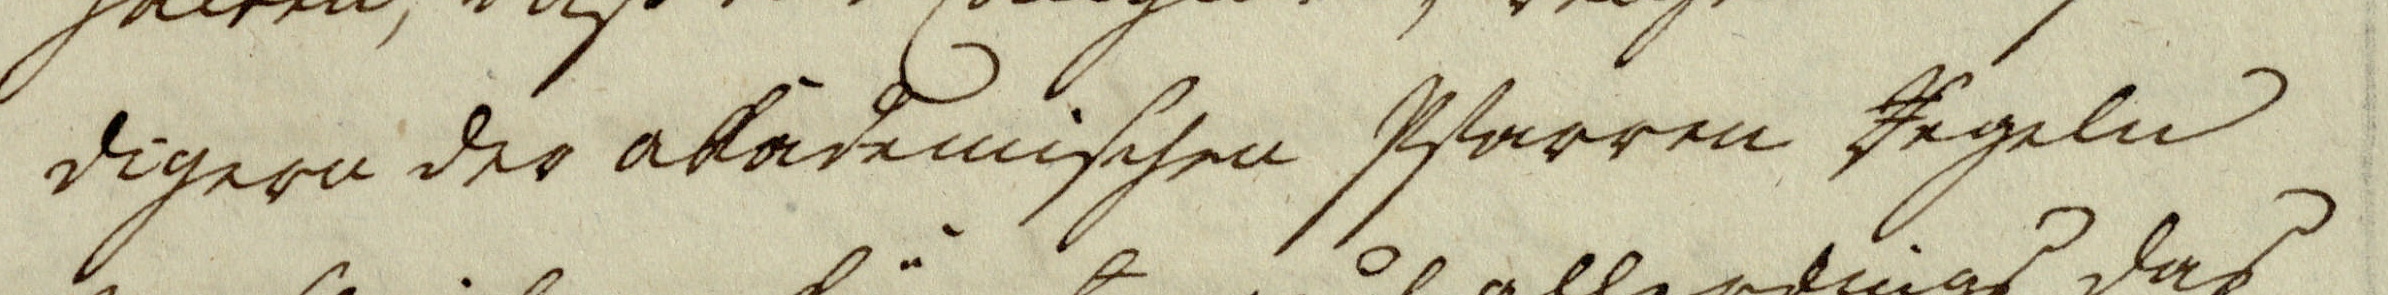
digern der akademischen Pfarren Regeln
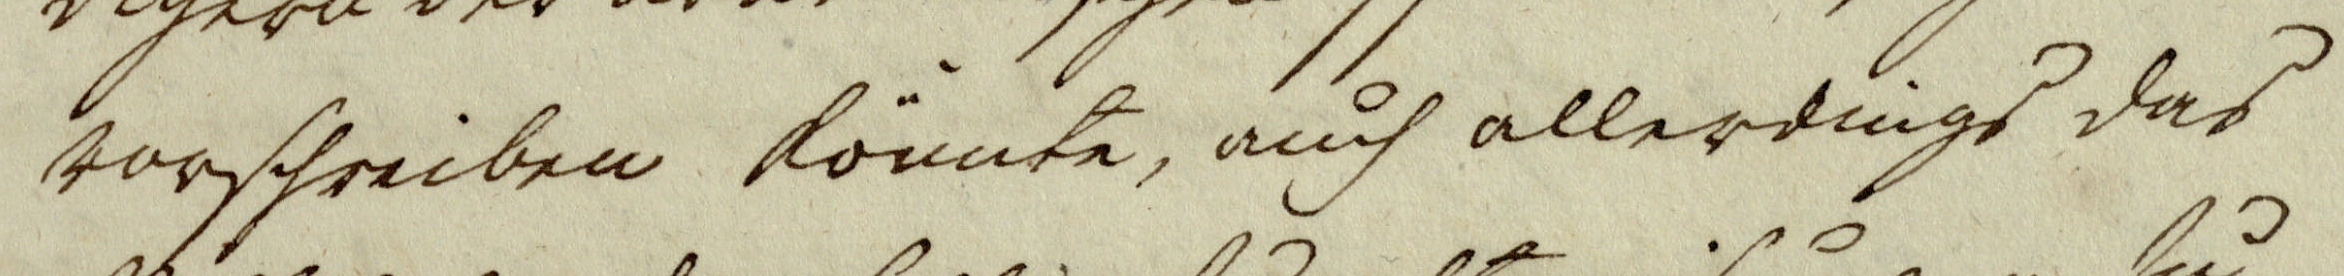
vorschreiben könnte, auch allerdings das
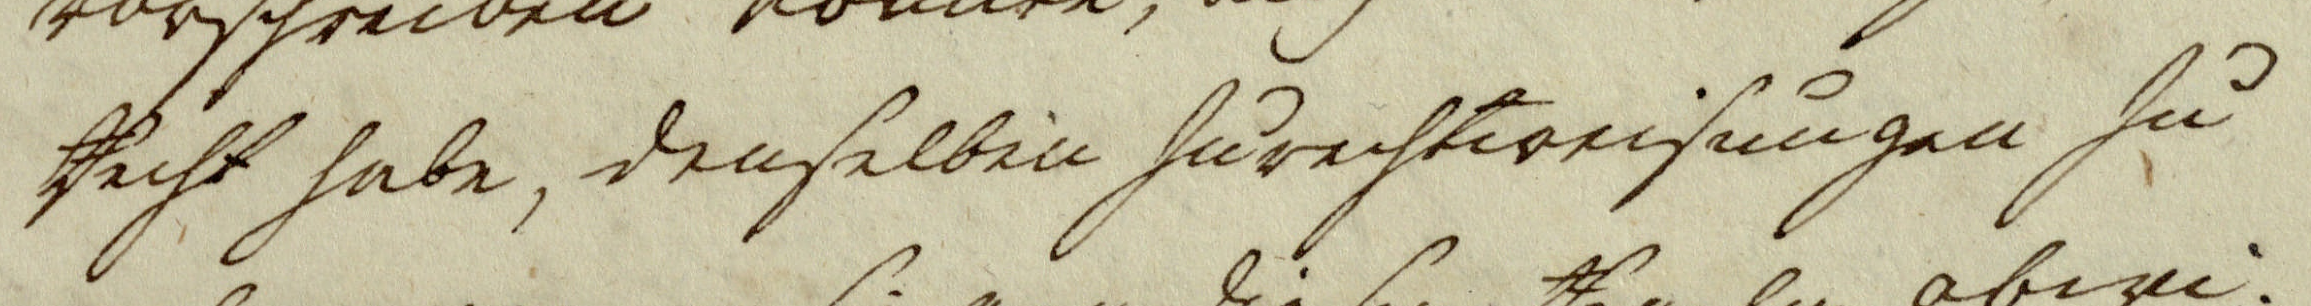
Recht habe, denselben Zurechtweisungen zu
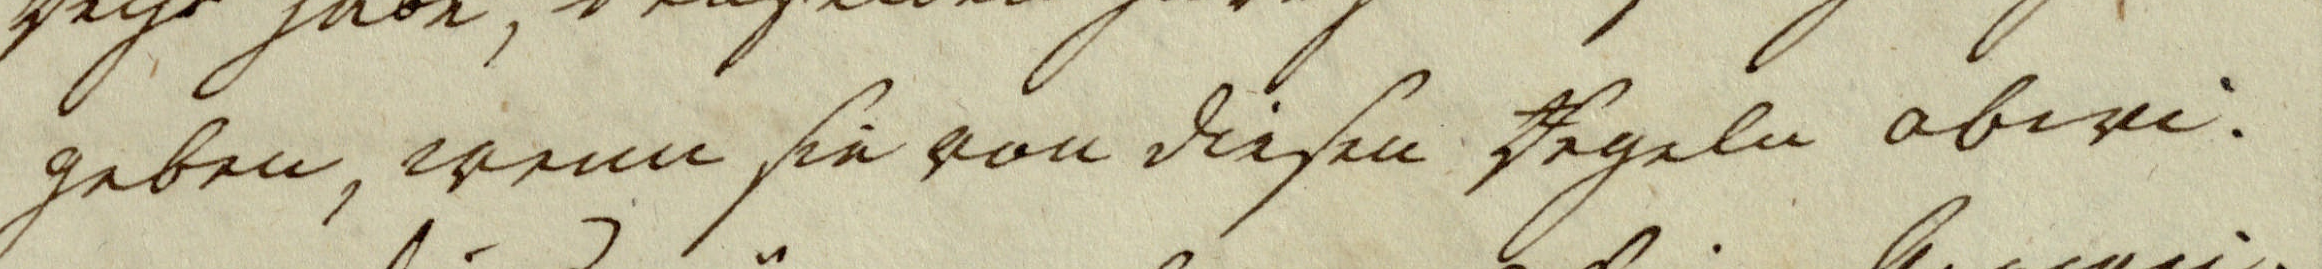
geben, wenn sie von diesen Regeln abwi¬
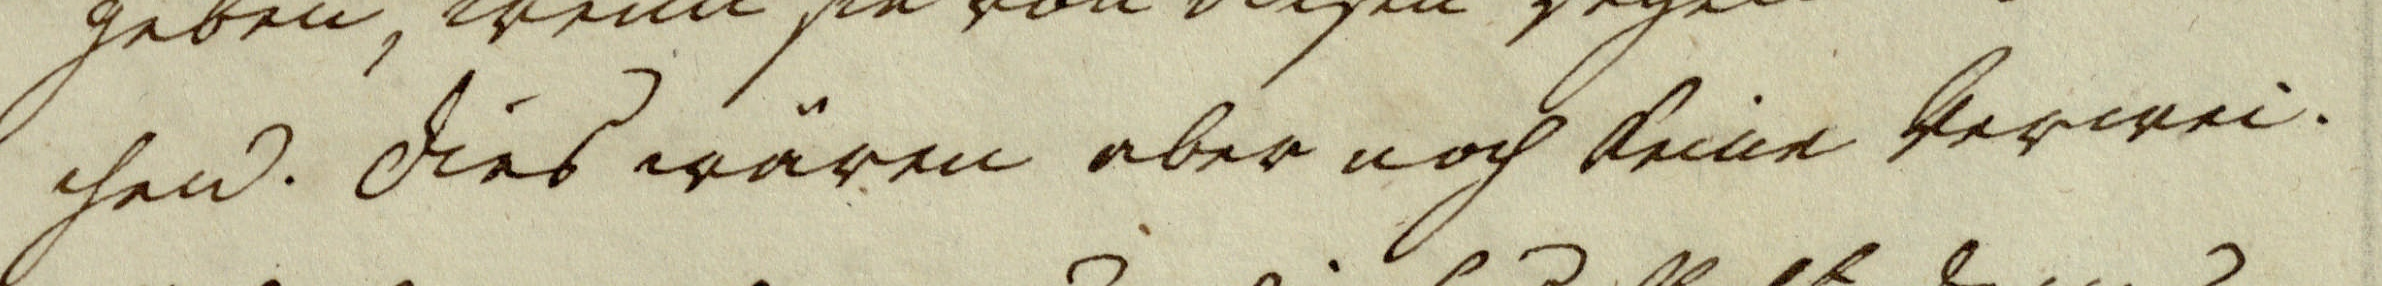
chen. Dies wären aber noch keine Verwei¬
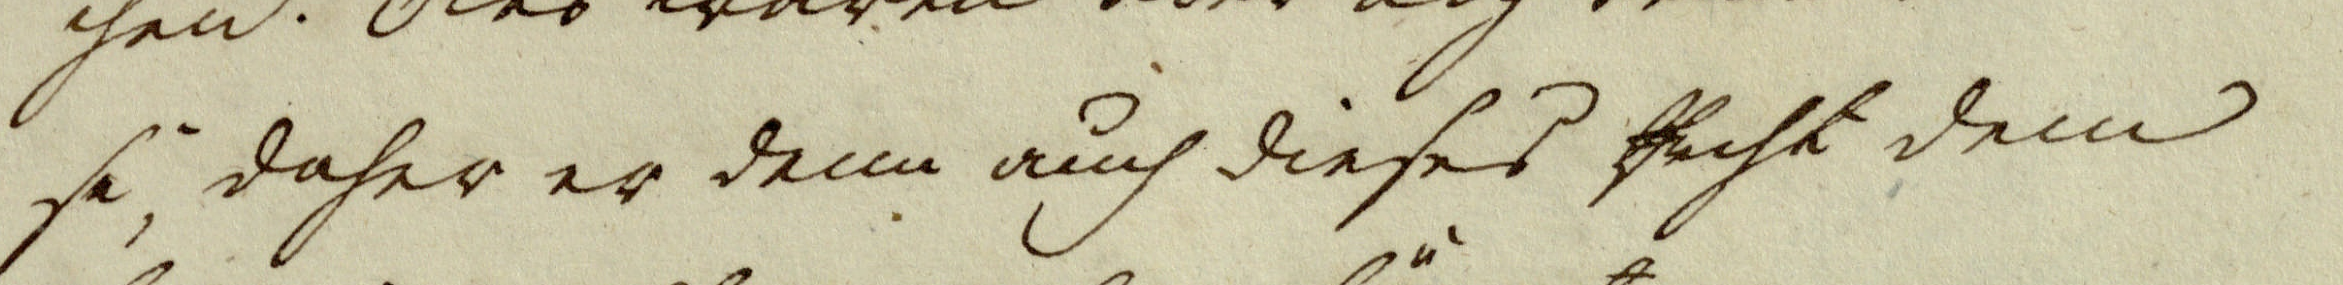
se, daher er denn auch dieses Recht dem
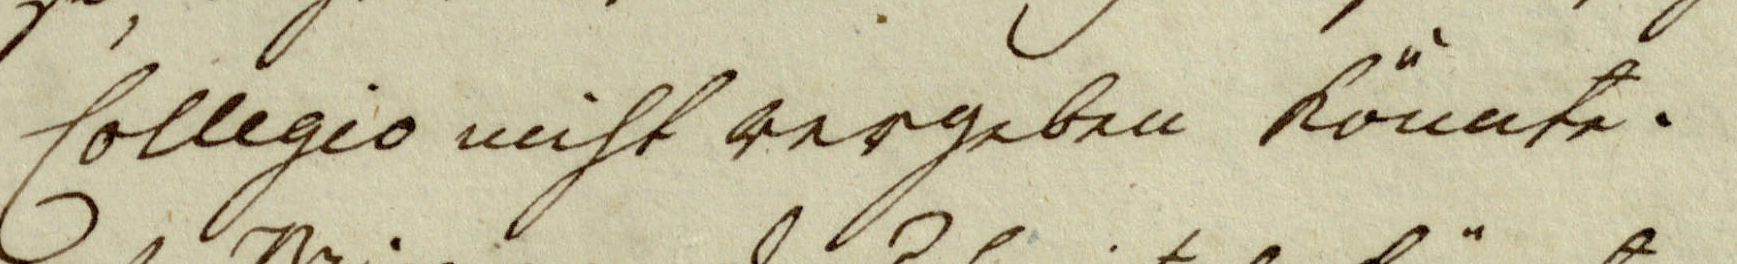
Collegio nicht vergeben könnte.
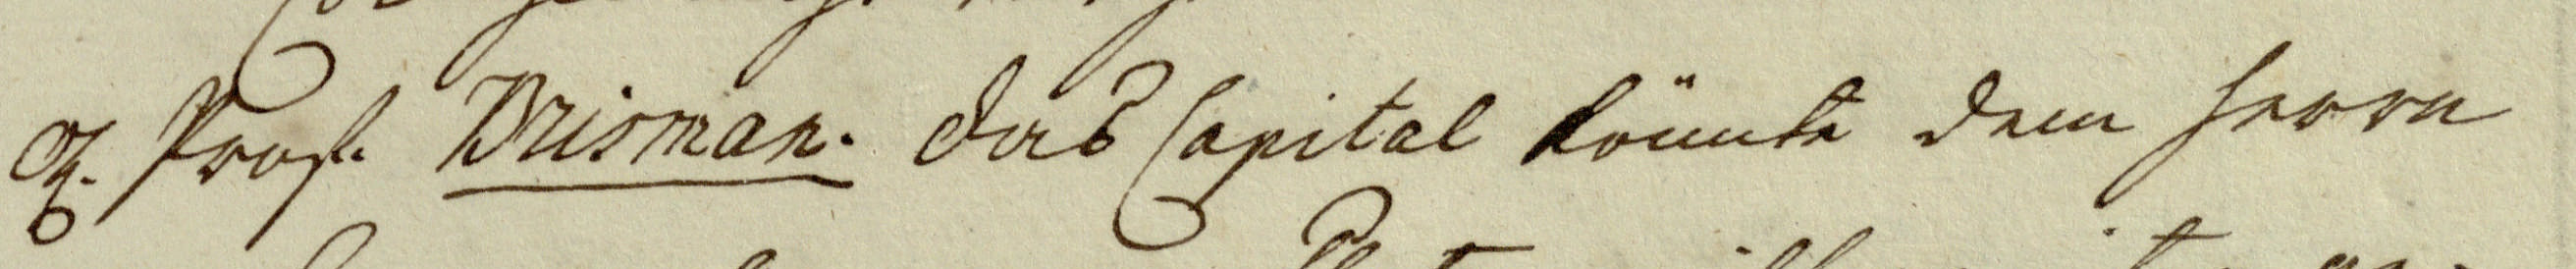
dh. Prof. Brisman. Das Capital könnte dem Herrn
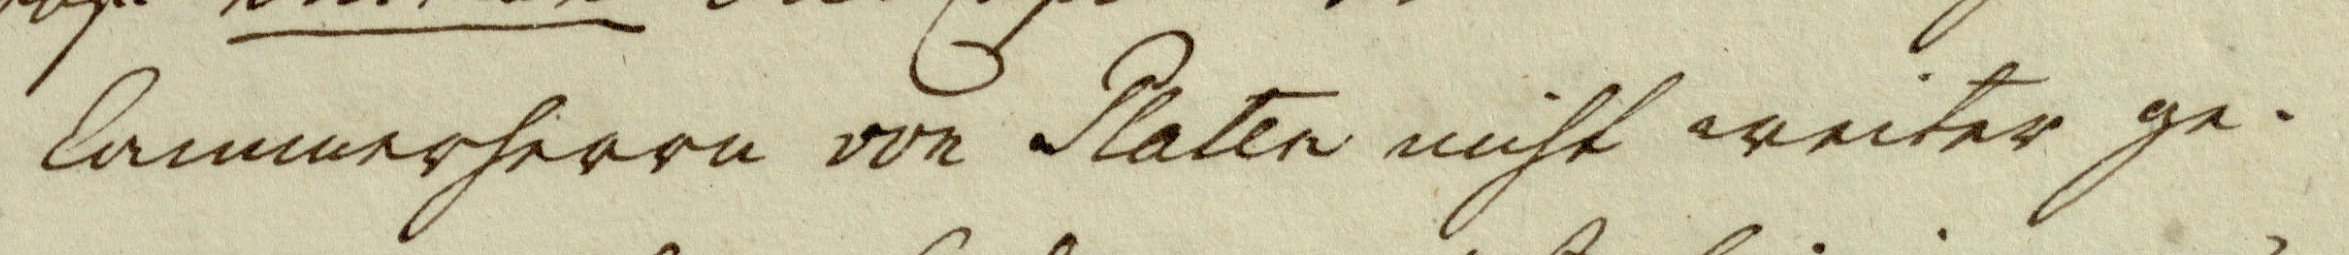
Cammerherrn von Platen nicht weiter ge¬
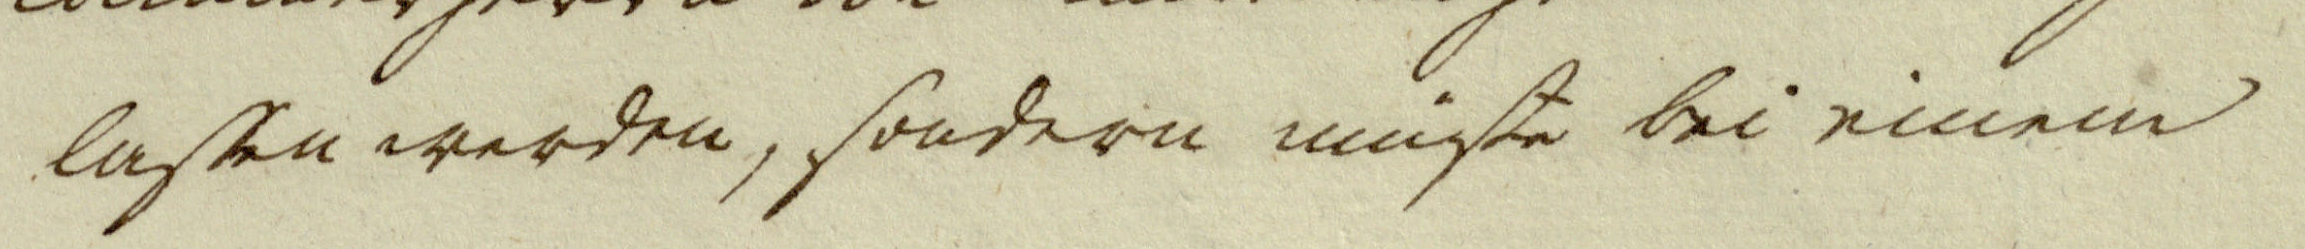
lassen werden, sondern müßte bei einem
